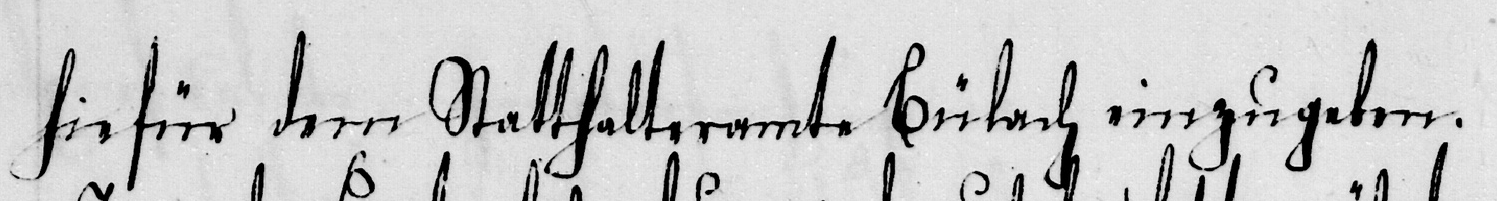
hiefür dem Statthalteramte Bülach einzugeben.
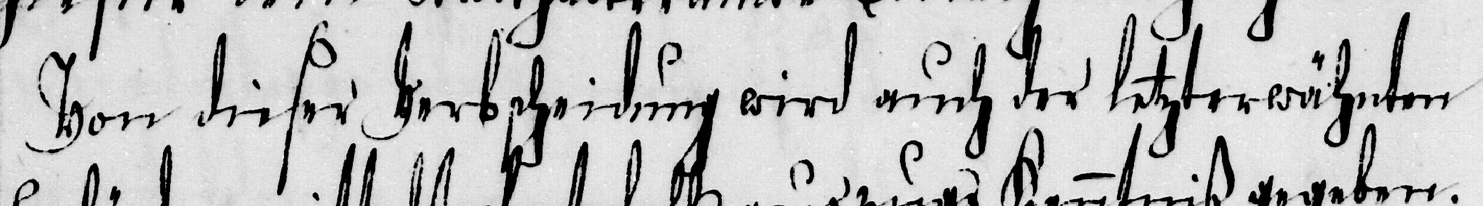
Von dieser Verbscheidung wird auch der letzterwähnten
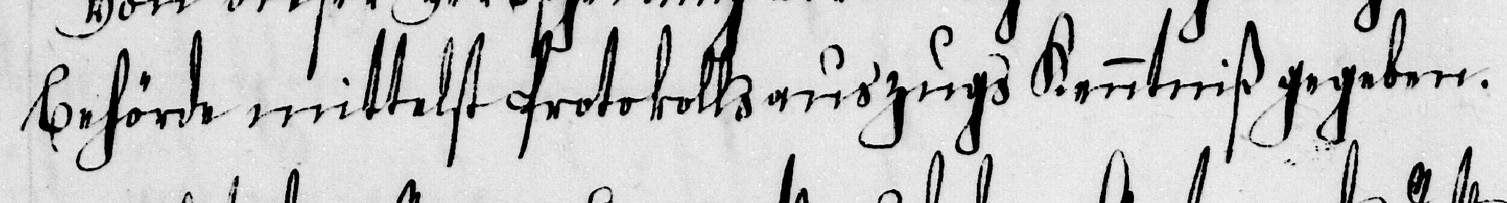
Behörde mittelst Protokollsauszugs Kenntniß gegeben.
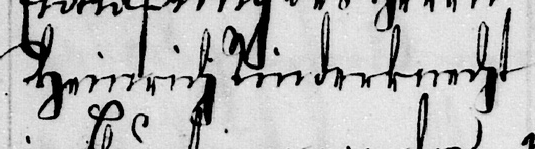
einrich Rinderknecht
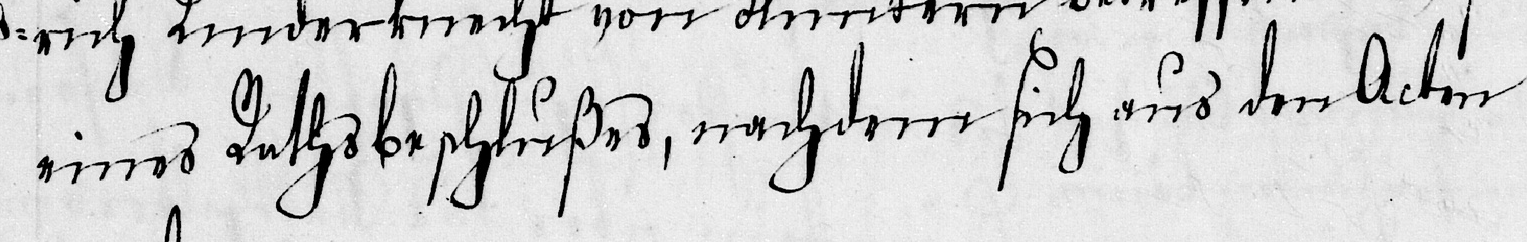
eines Rathsbeschlußes, nachdem sich aus den Acten
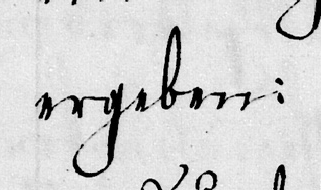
ergeben:
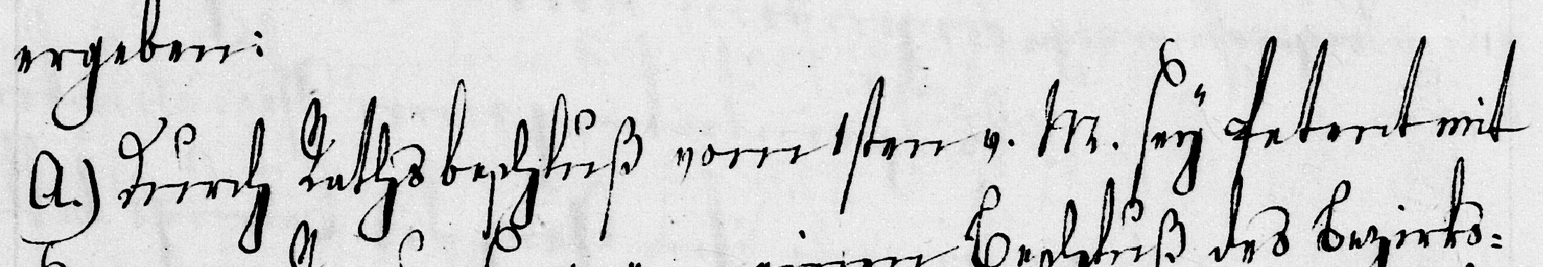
A.) Durch Rathsbeschluß vom 1sten v. M. sey Petent mit
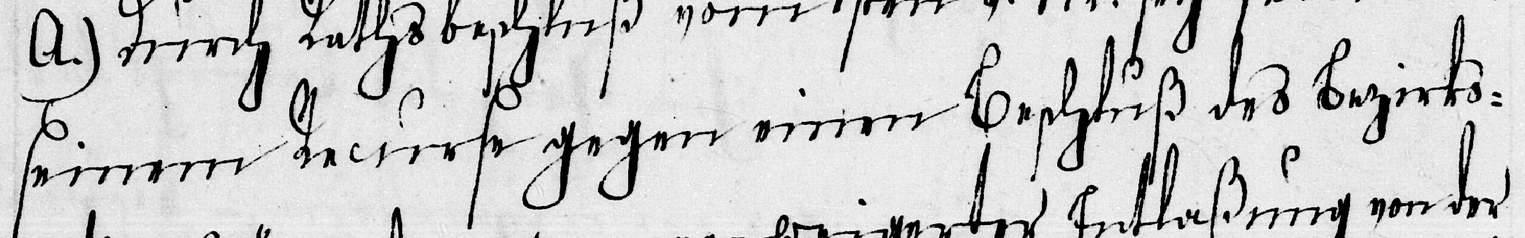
seinem Recurse gegen einen Beschluß des Bezirks¬
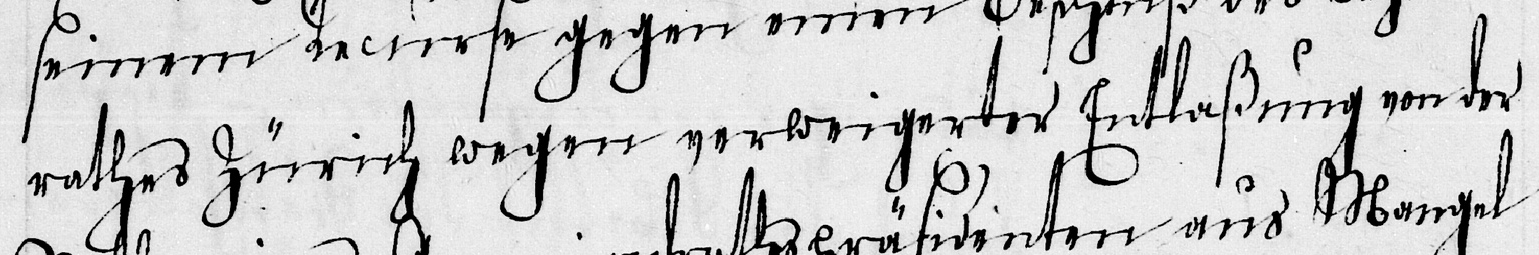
rathes Zürich wegen verweigerter Entlaßung von der
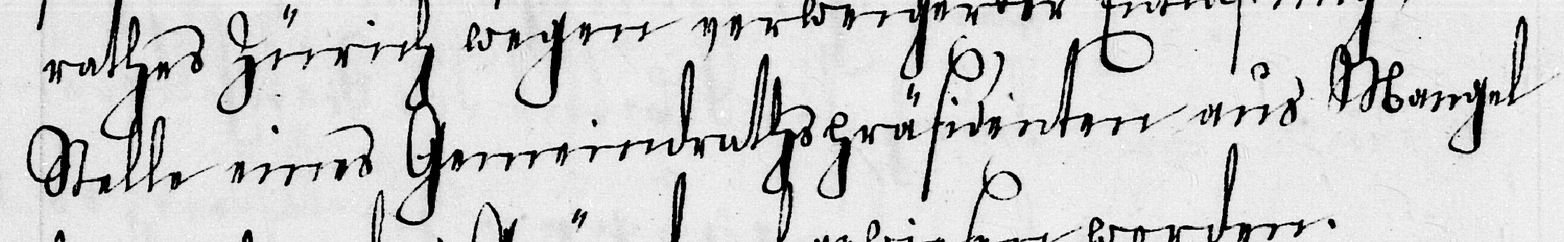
Stelle eines Gemeindspräsidenten aus Mangel
